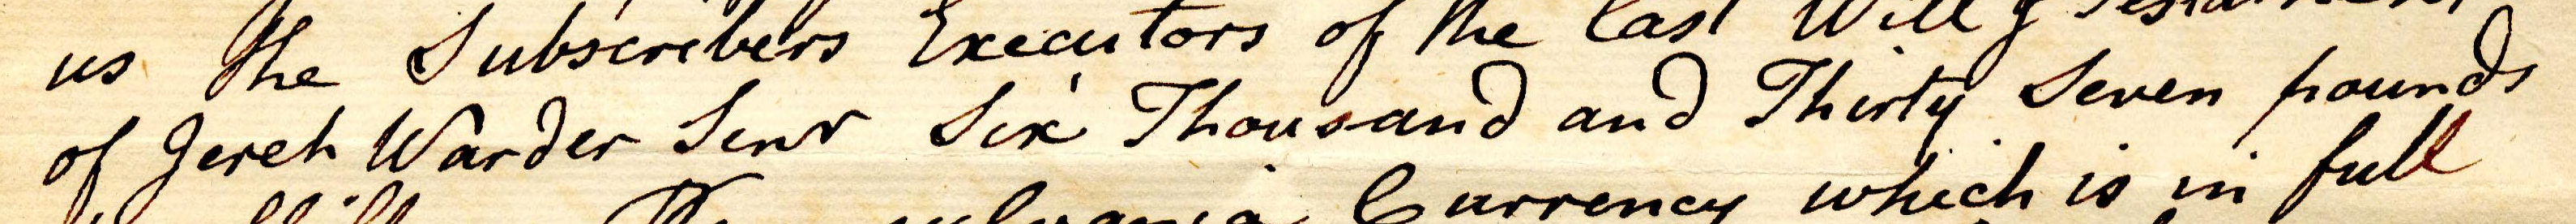of Jereh Warder Sen^r Six Thousand and Thirty Seven pounds
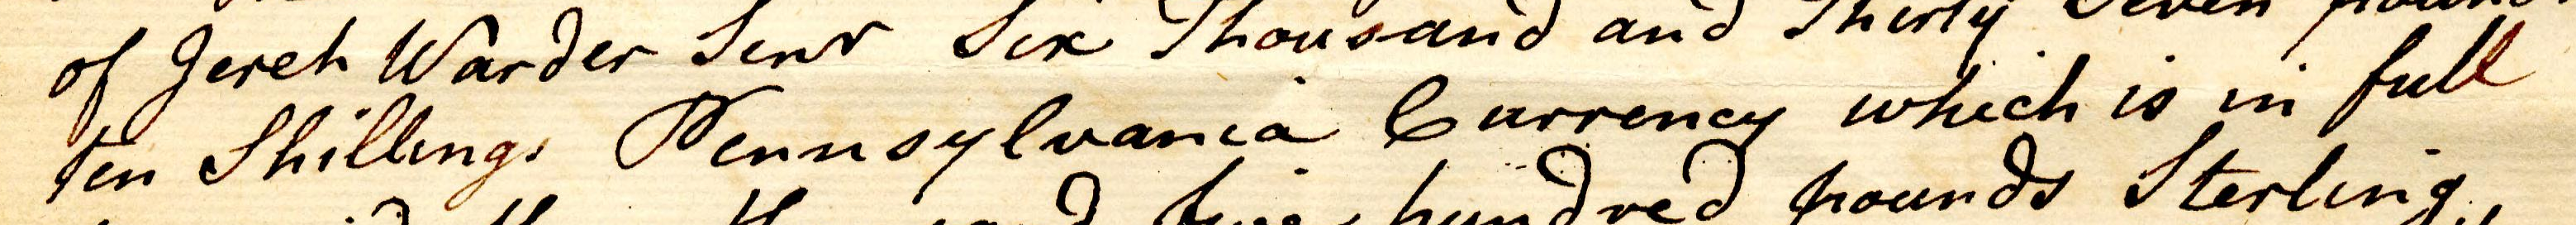Ten Shillings Pennsylvania Currency which is in full
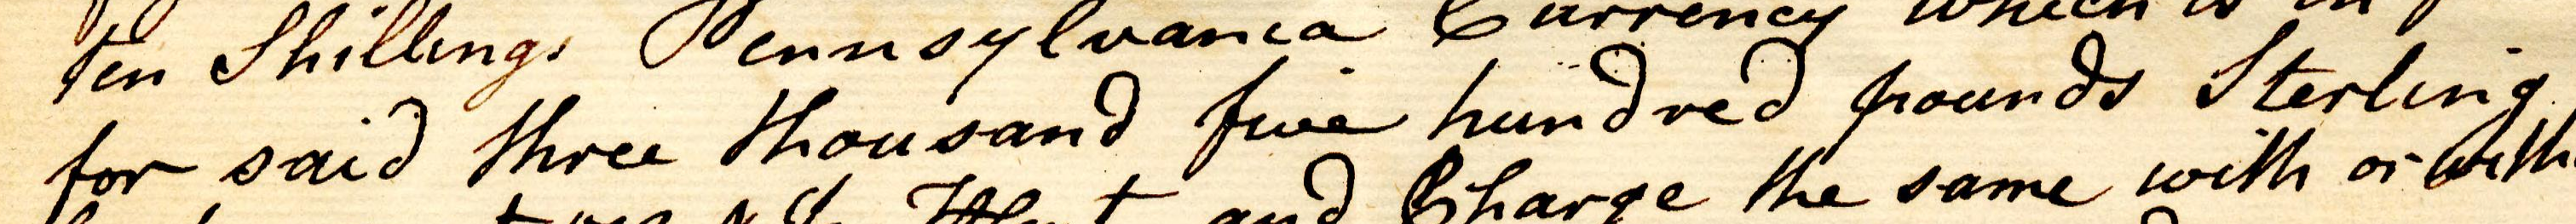for said three thousand five hundred pounds Sterling
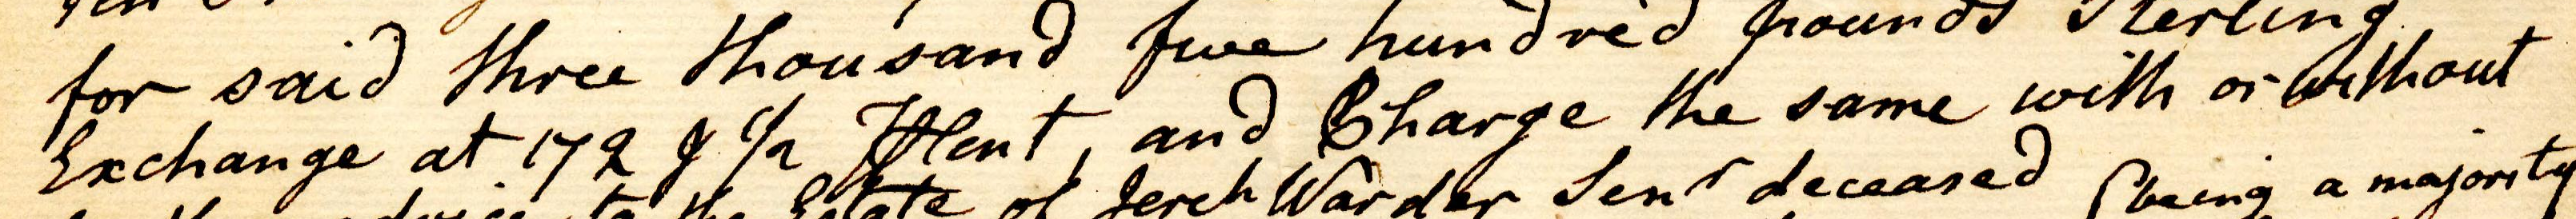Exchange at 172 & 1/2 Percent, and Charge the same with or without
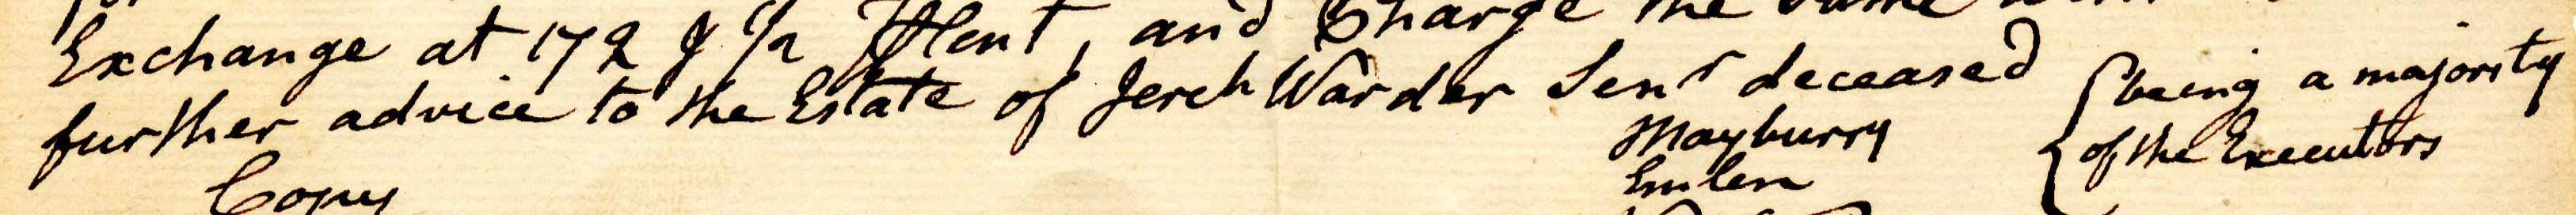further advice to the Estate of Jereh Warder Sen^r deceased being a majority
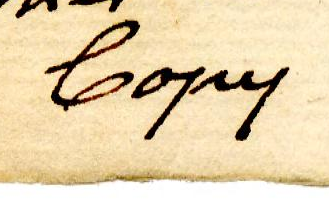Copy
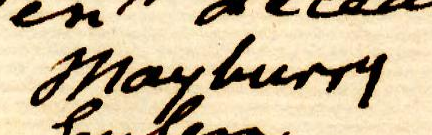Mayburry
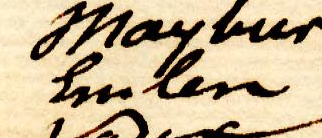Emlen
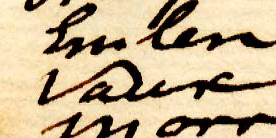Vaux
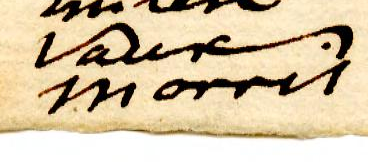Morris
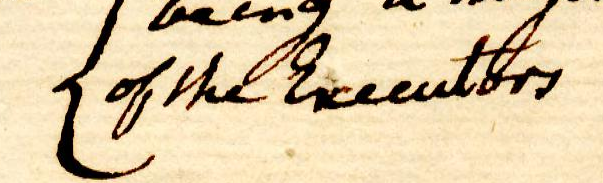of the Executors
